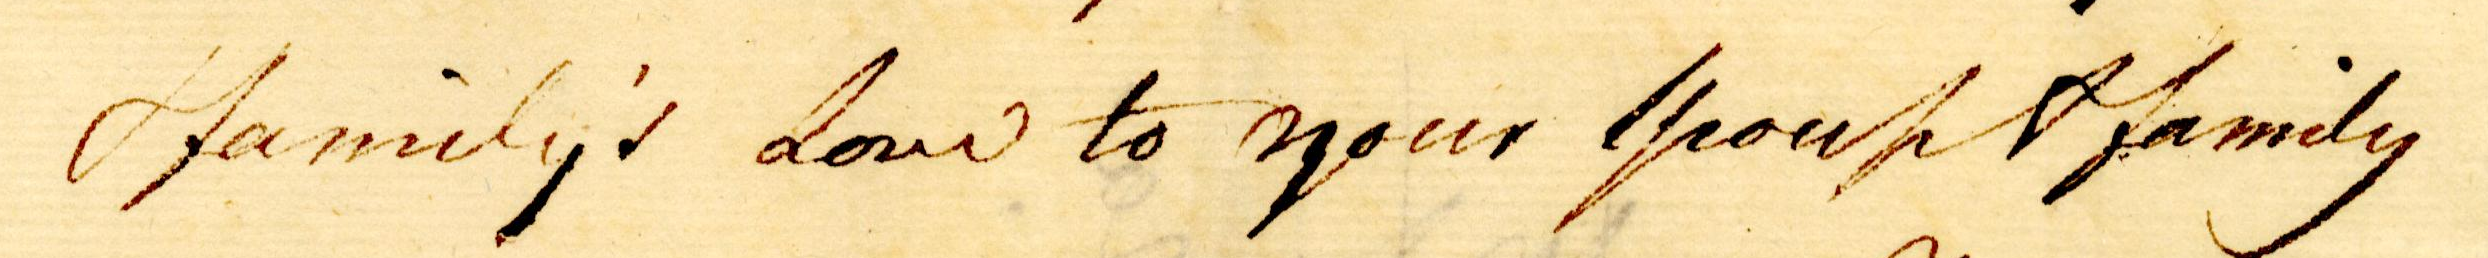& family's love to your spouse & family
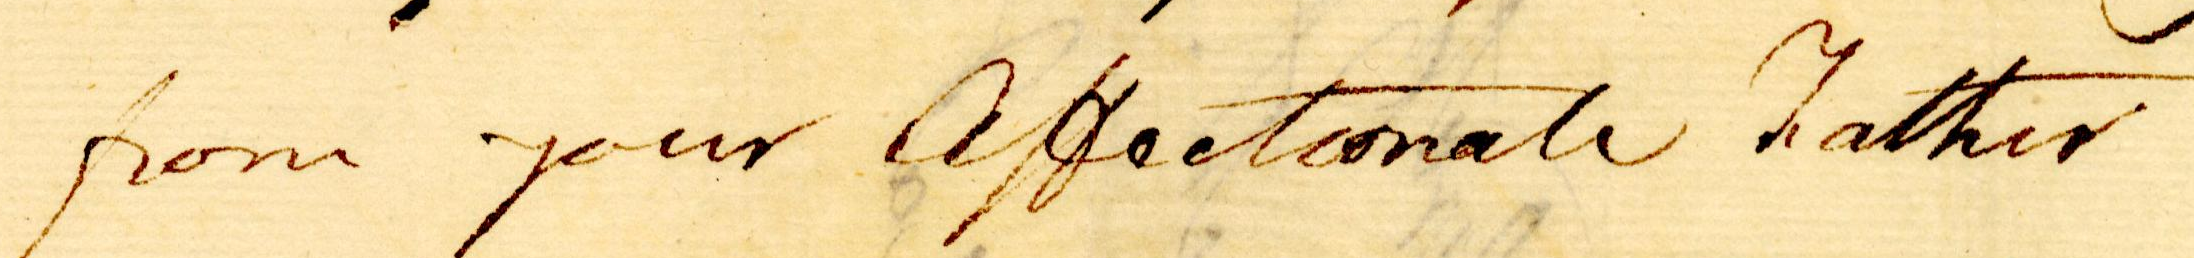from your Affectionate Father
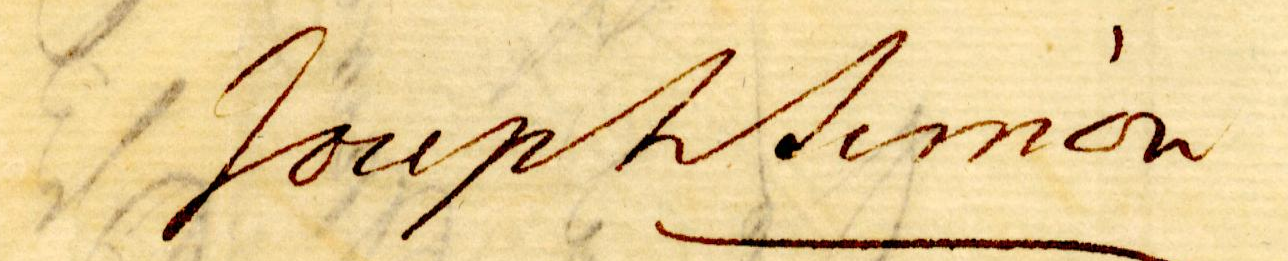Joseph Simon
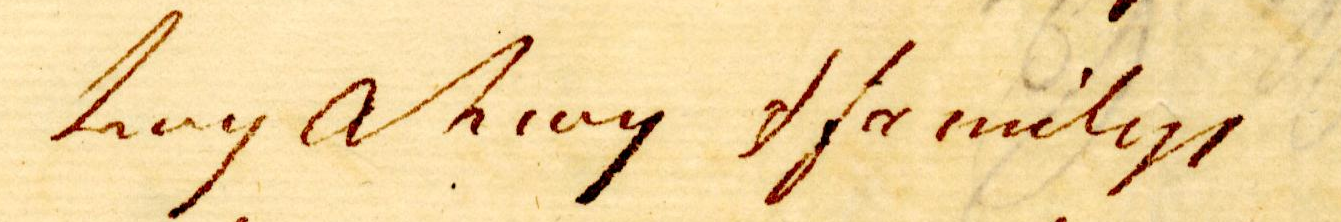Lucy A Levy & familys
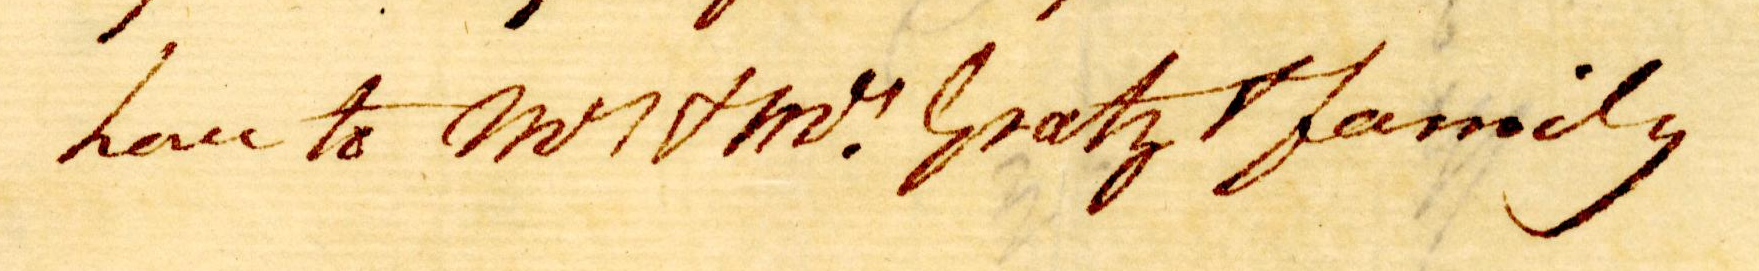love to M^r & M^rs. Gratz & family
